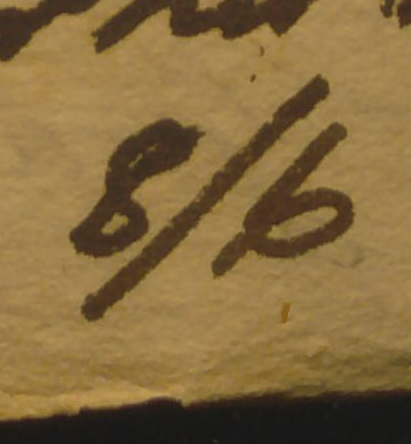8s6
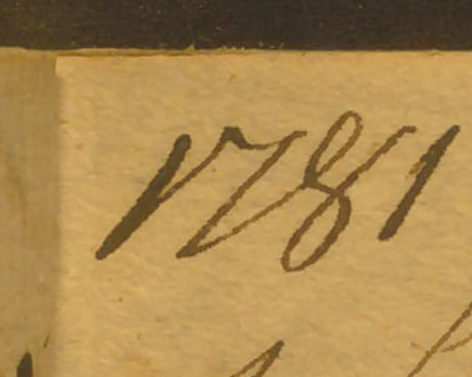1781
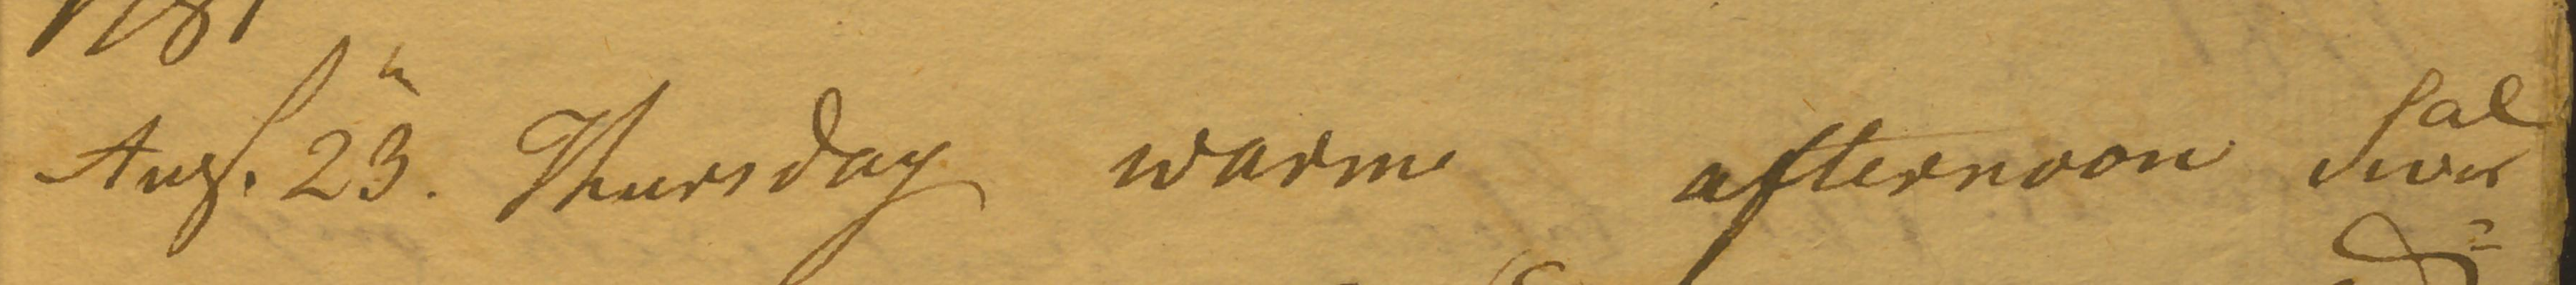Aug^t. 23th. Thursday warm afternoon Sever^al
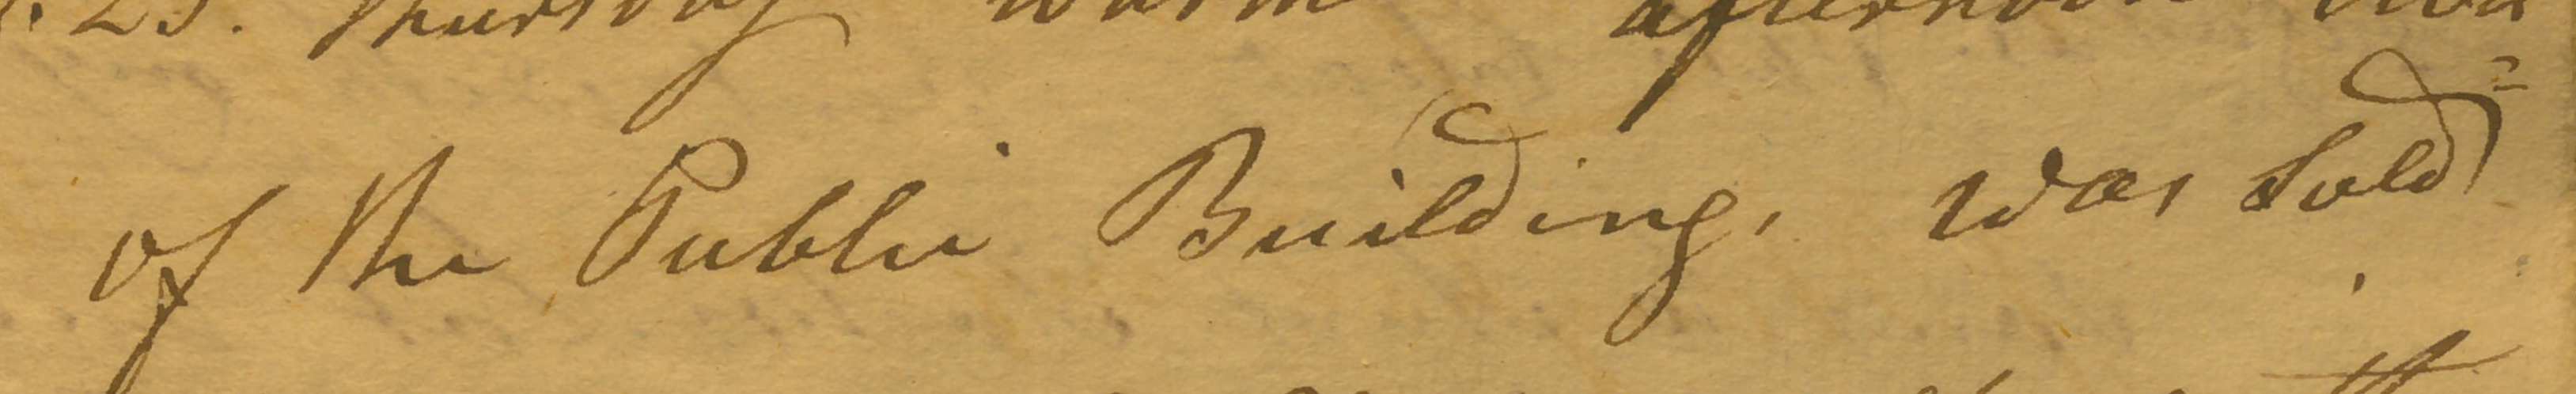of the Public Building, was sold
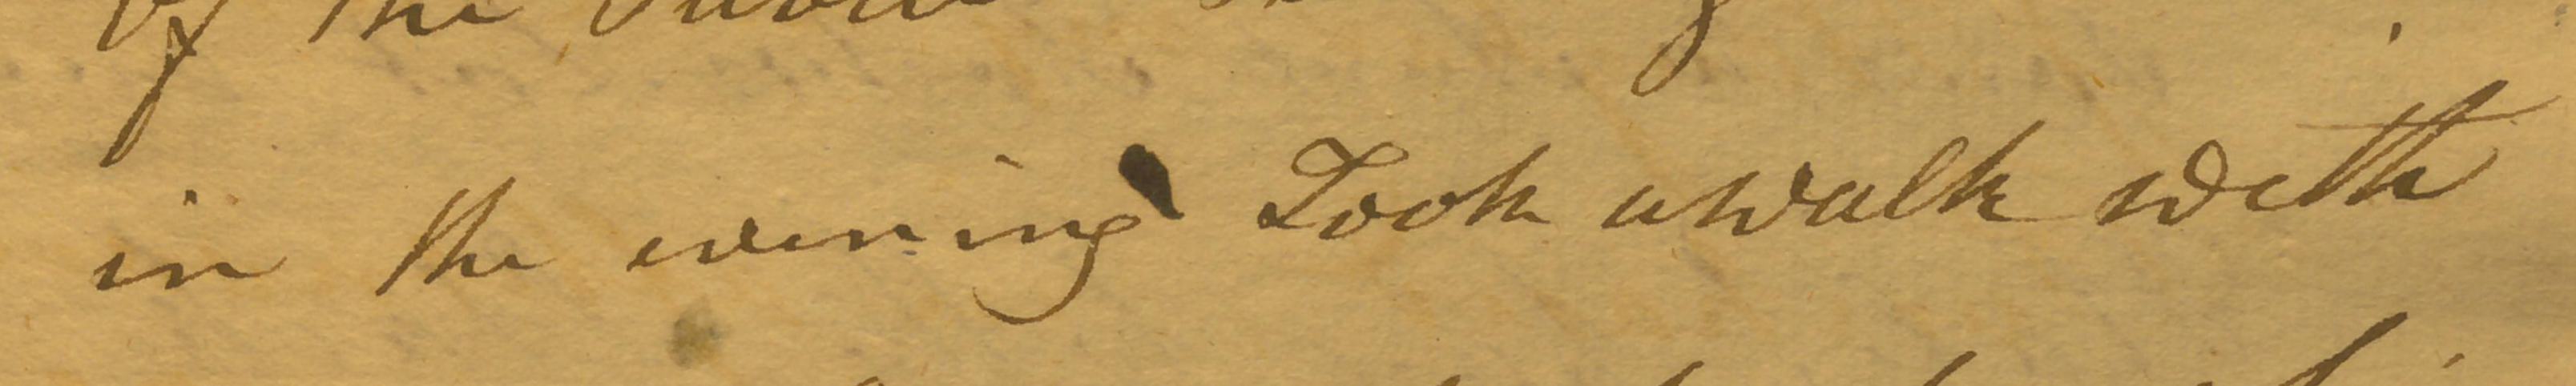in the evening Took a walk with
